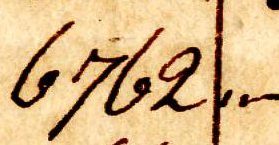6762..-
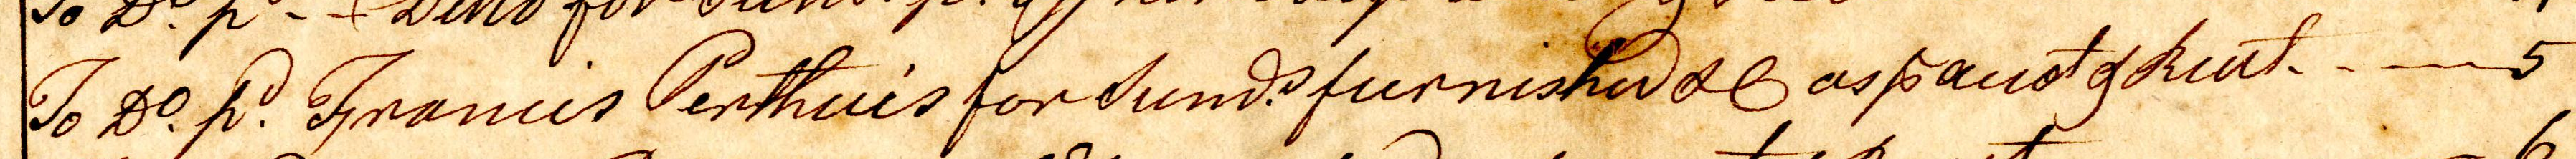To D^o. p^d. Francis Perthuis for Sund^s furnished &c as per acco^t & rece^t.---5
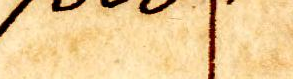7660..-
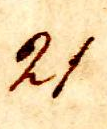21
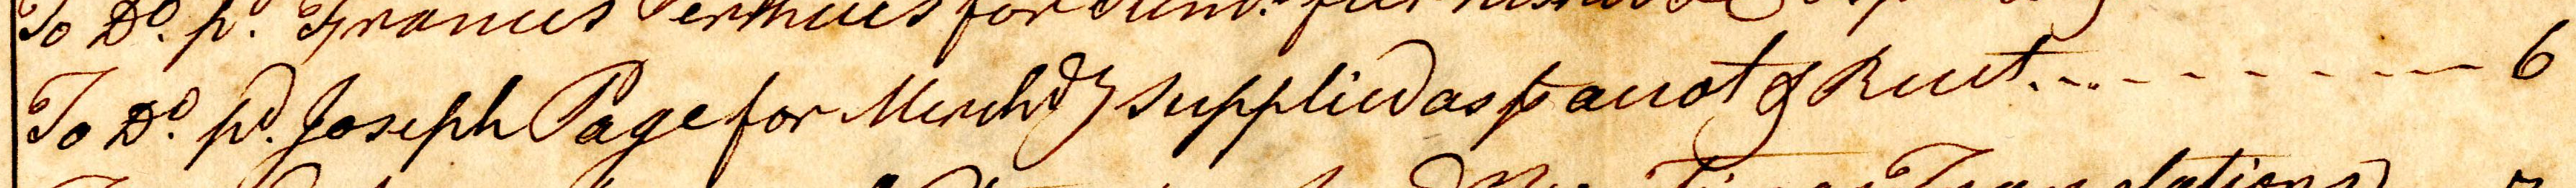To D^o. p^d. Joseph Page for Merch^dz supplied as per acco^t & Rece^t.- 6
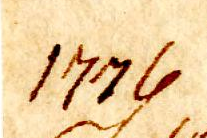1776
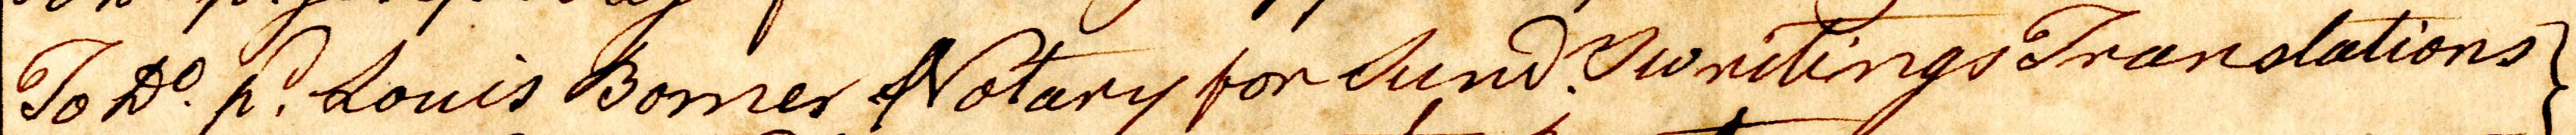To D^o. p^d. Louis Bomer Notary for sund^ry. writings Translations
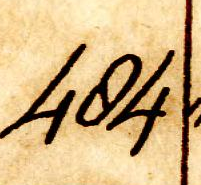404
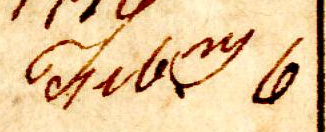Feb^ry 6
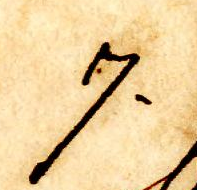7.
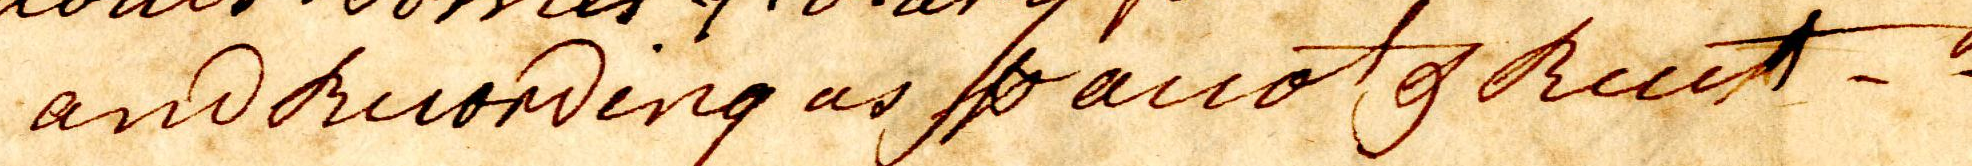and Recording as per acco^t & Rece^t-
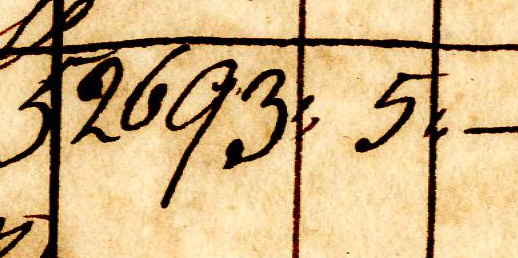52693..5..-
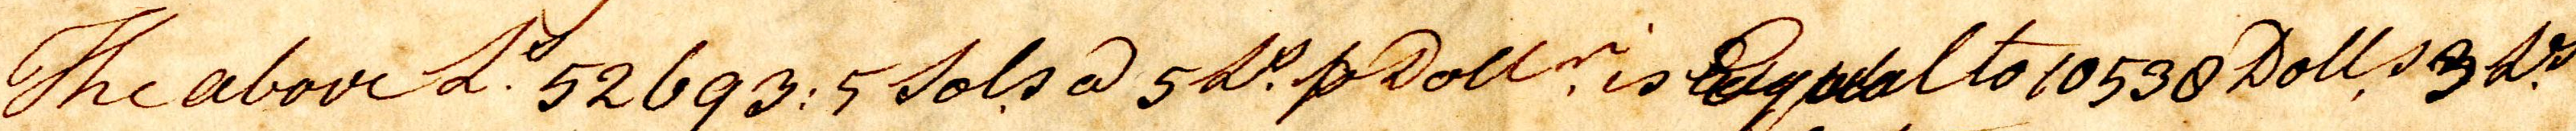The above £52693:5 sols @ 5^L^s. per Doll^r. is equal to 10530 Doll^s 3 L^s
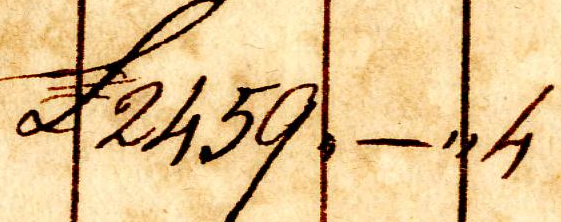£2459..-..4
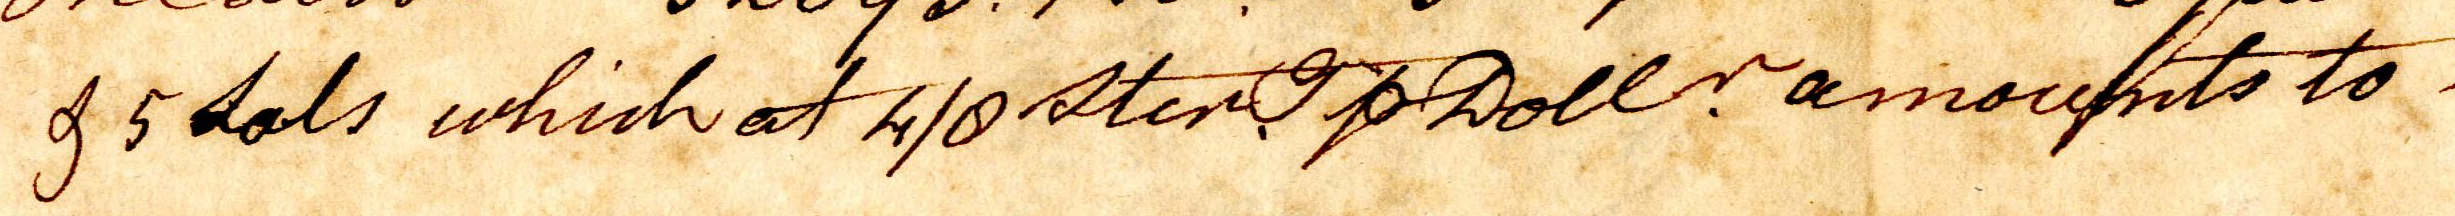& 5 sols which at 4s0 Ster^g. per Doll^r. amounts to
